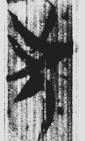先
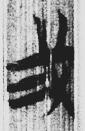或（國）
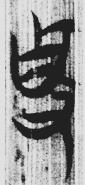○（變）
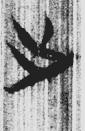之
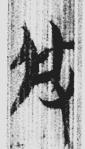攸（修）
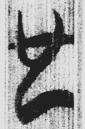也
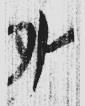外
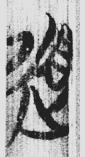道
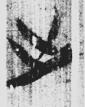之
